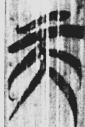天
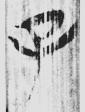子
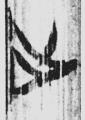之
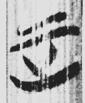正
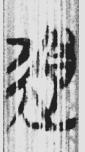道
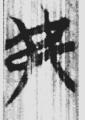弗
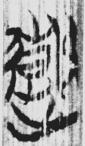○（朝）
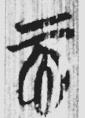而
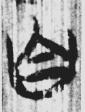自
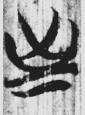至
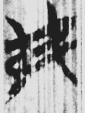弗
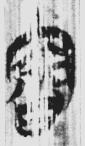○（審）
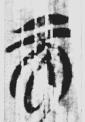而
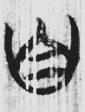自
